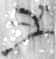之
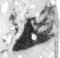幽
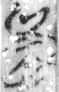○（疑）
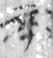不
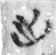出
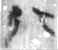北
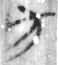方
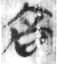高
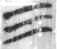三
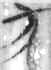方
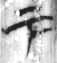下
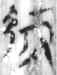凥（居）
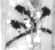之
